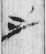之
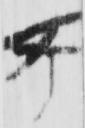不
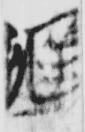𬨭（將）
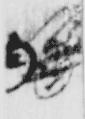䌛
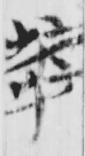發
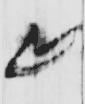㠯（以）
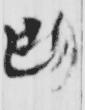○（廷）
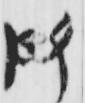阩
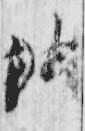門
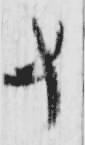又
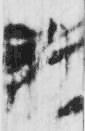阩
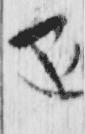疋
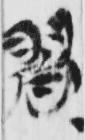○（旌）
